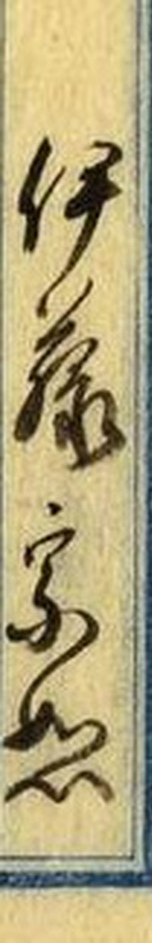伊藤宗恕
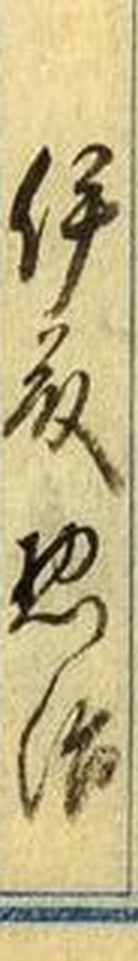伊藤惣治
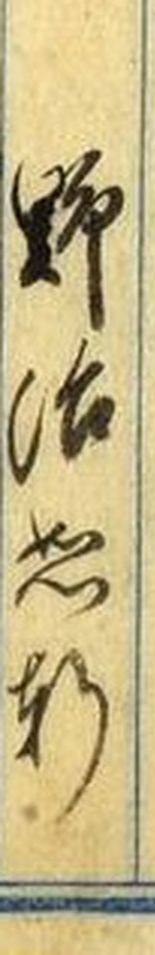野治恕軒

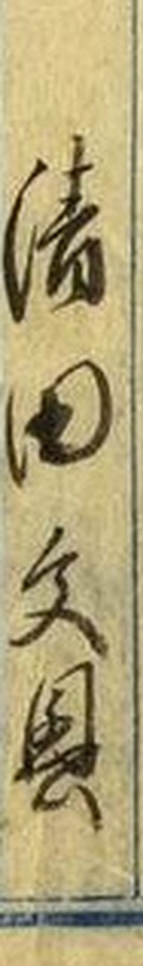清田文奥
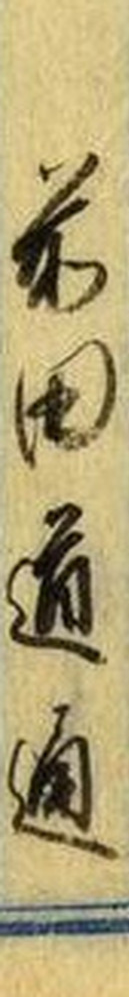前田道通
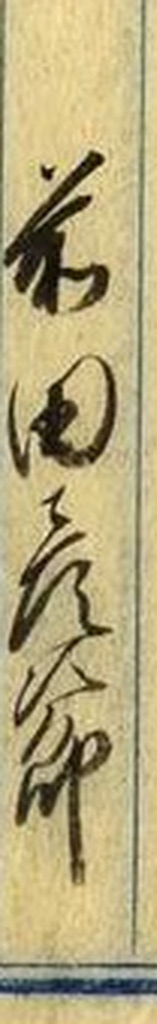前田彦次郎
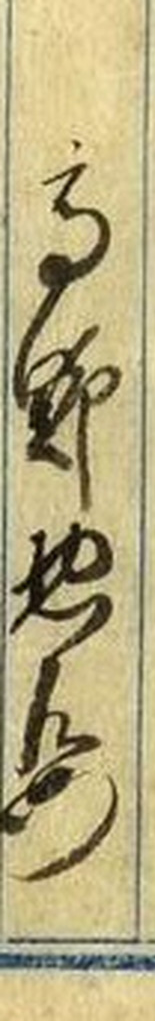高野惣左衛門
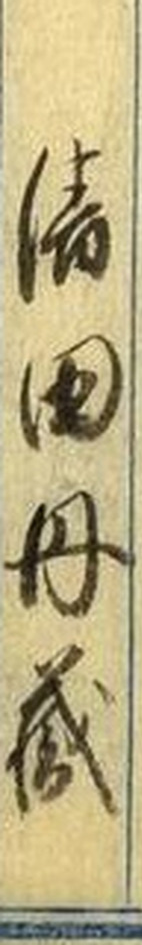清田丹蔵

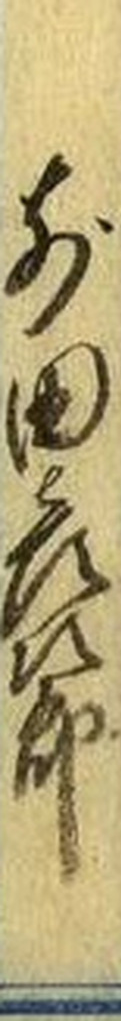前田彦次郎
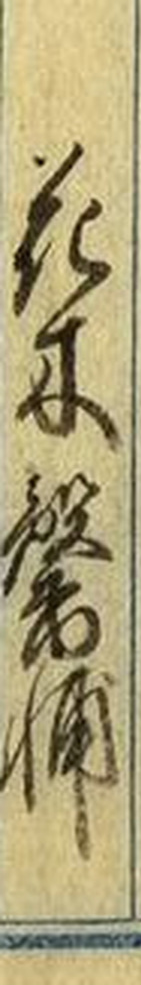花木馨輔
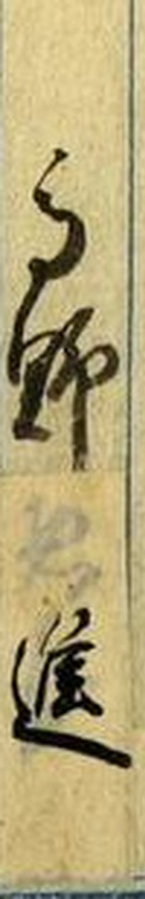高野進

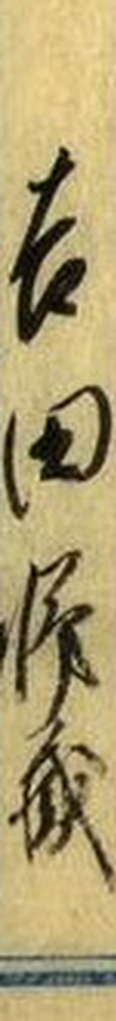吉田悌蔵
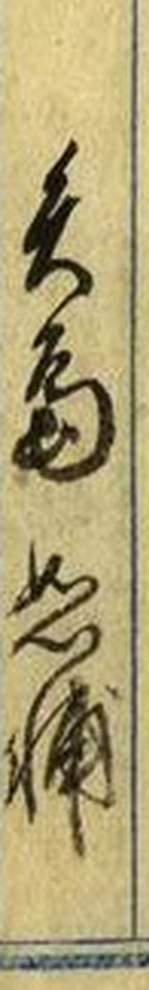矢島恕輔
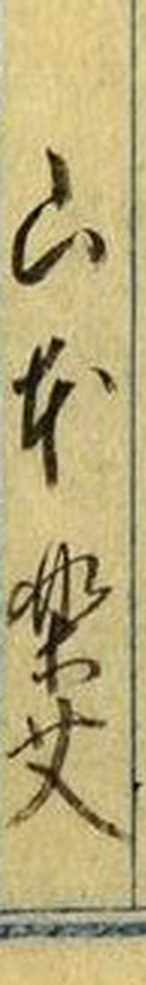山本楽艾
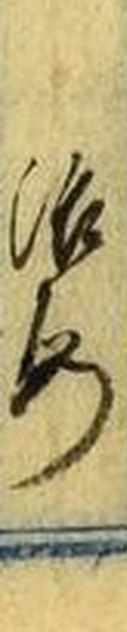治右衛門
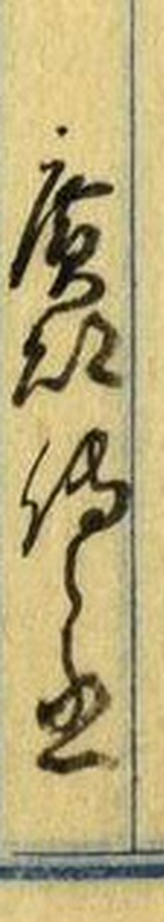広部伝之丞
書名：温古集 四巻
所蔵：福井県文書館 Fukui Prefectural Archives
